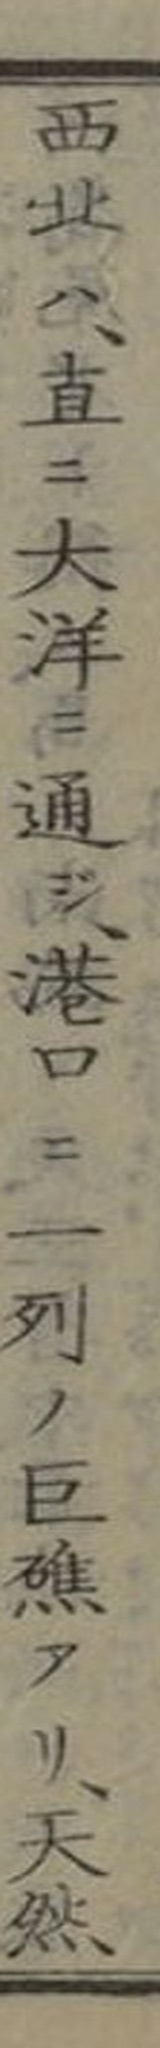西北ハ、直ニ大洋ニ通ジ、港口ニ一列ノ巨礁アリ、天然
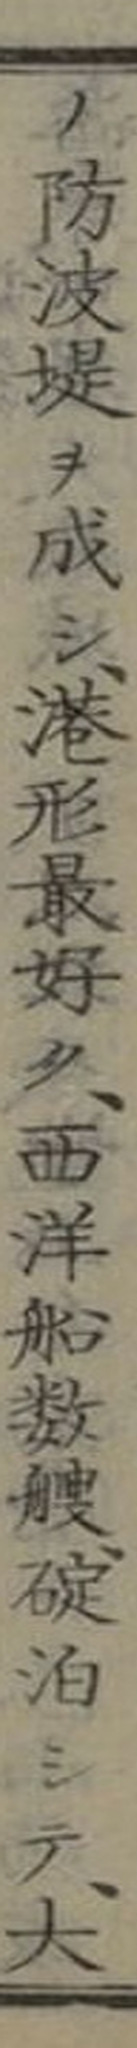ノ防波堤ヲ成シ、港形最好ク、西洋船数艘、碇泊シテ、大
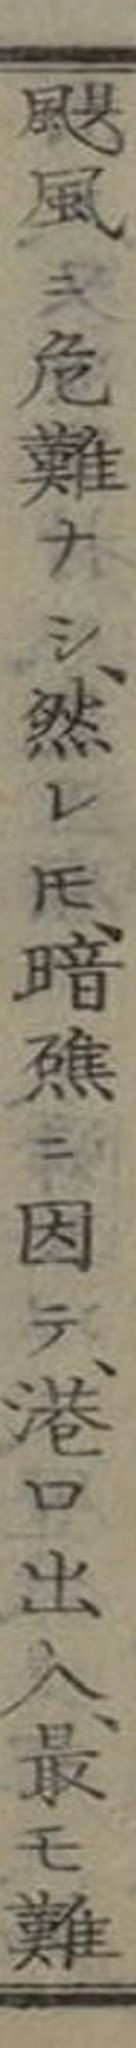颶風ニ危難ナシ、然レトモ、暗礁ニ因テ、港口出入、最モ難
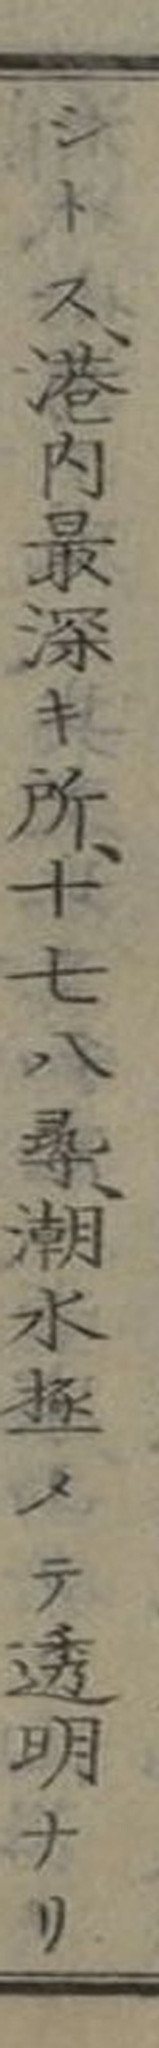シトス、港内最深キ所、十七八尋、潮水極メテ透明ナリ
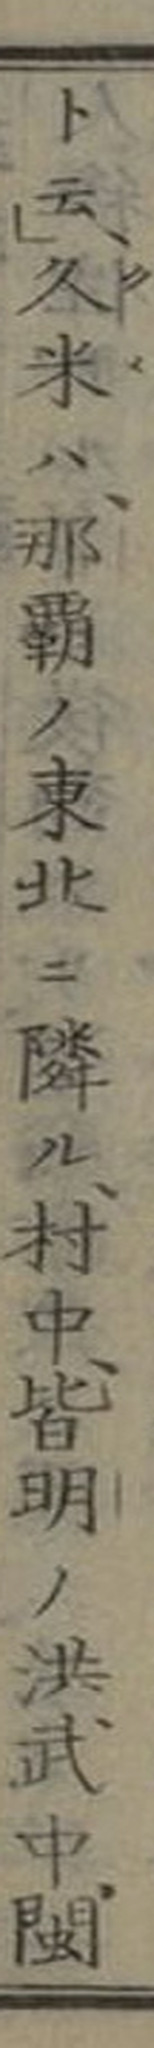ト云、」久米ハ、那覇ノ東北ニ隣ル、村中、皆明ノ洪武中、閩

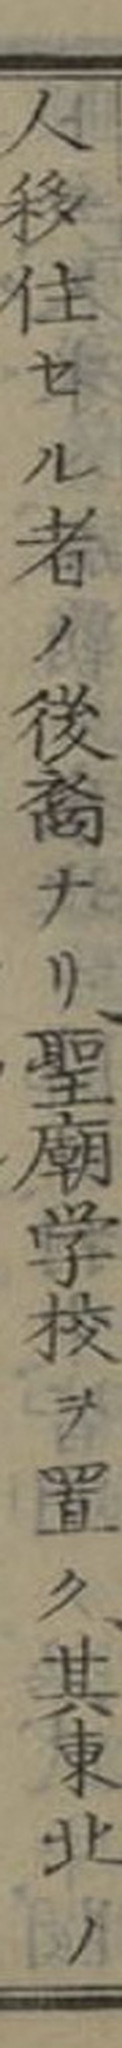人移住セル者ノ後裔ナリ、聖廟学校ヲ置ク、其東北ノ
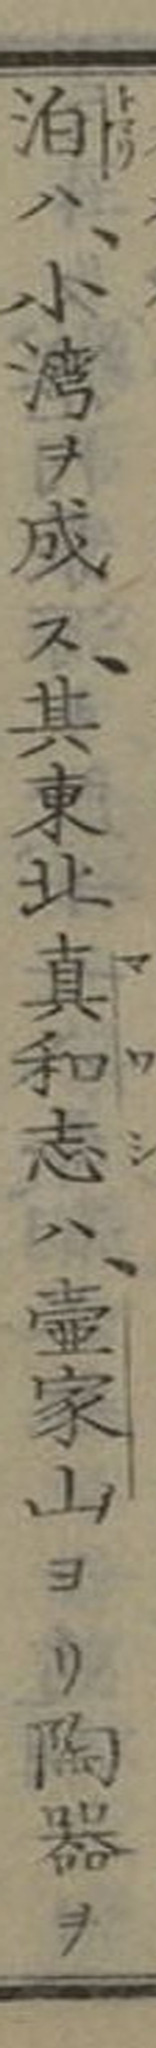泊ハ、小湾ヲ成ス、其東北真和志ハ、壺家山ヨリ陶器ヲ
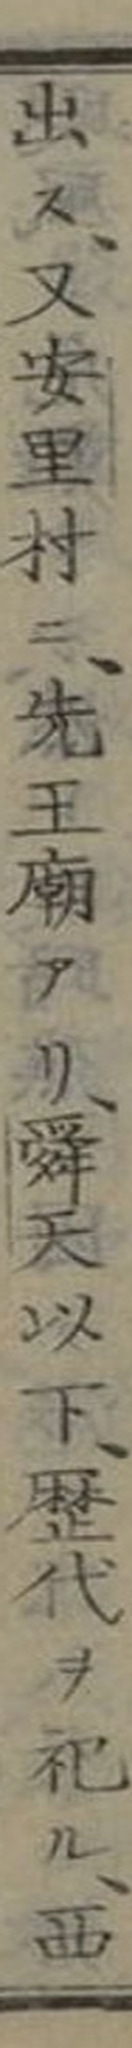出ス、又安里村ニ、先王廟アリ、舜天以下、歴代ヲ祀ル、西
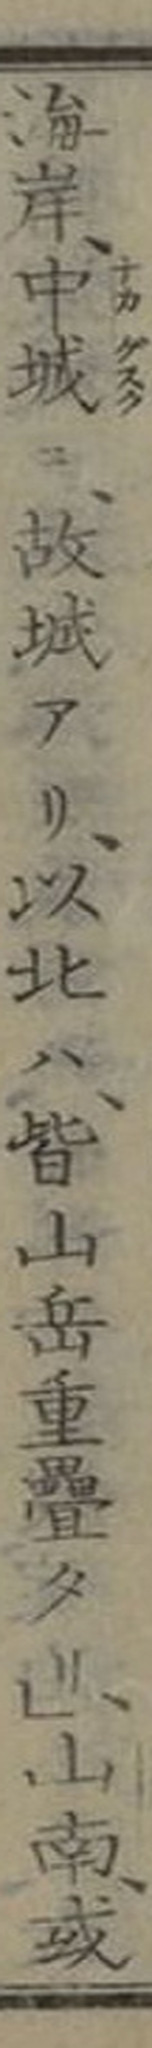海岸、中城ニ、故城アリ、以北ハ、皆山岳重畳タリ、」山南、或
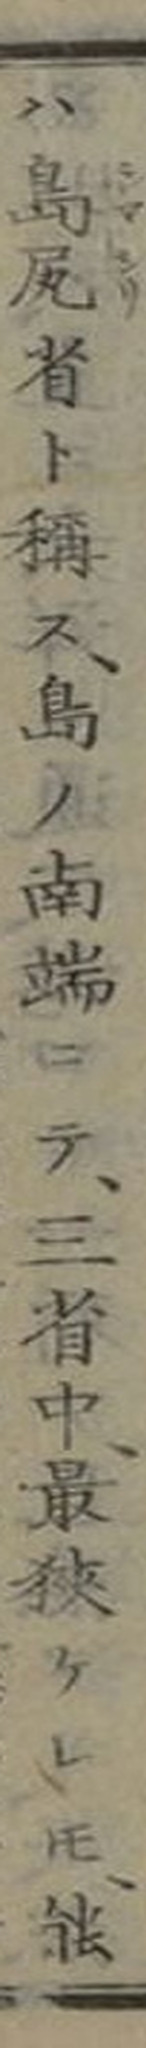ハ島尻省ト称ス、島ノ南端ニテ、三省中、最狭ケレトモ、能
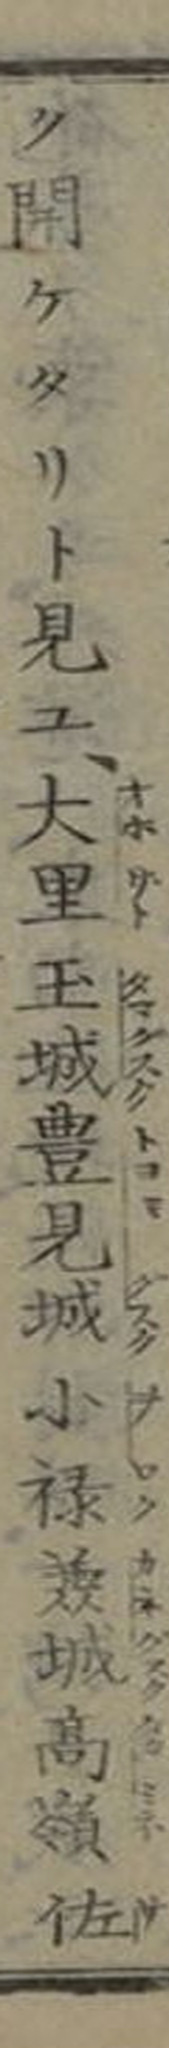ク開ケタリト見ユ、大里玉城豊見城小禄兼城高嶺佐
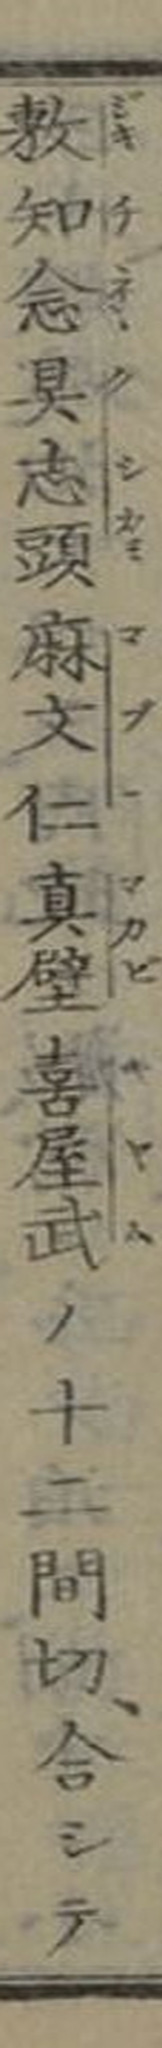敷知念具志頭麻文仁真壁喜屋武ノ十二間切、合シテ
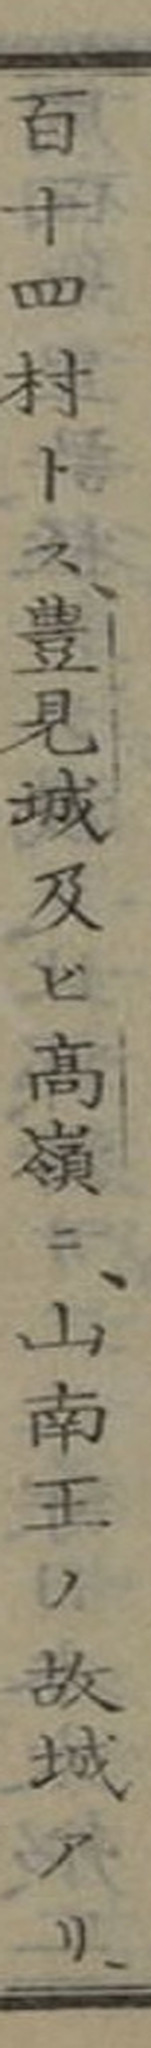百十四村トス、豊見城及ビ高嶺ニ、山南王ノ故城アリ、
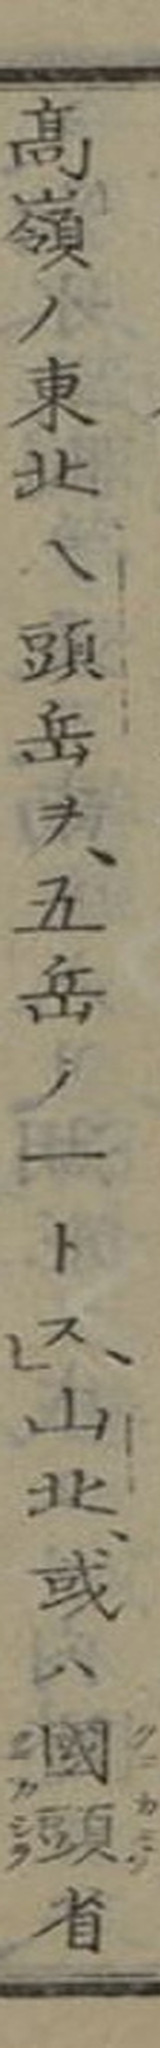高嶺ノ東北八頭岳ヲ、五岳ノ一トス、」山北、或ハ国頭省
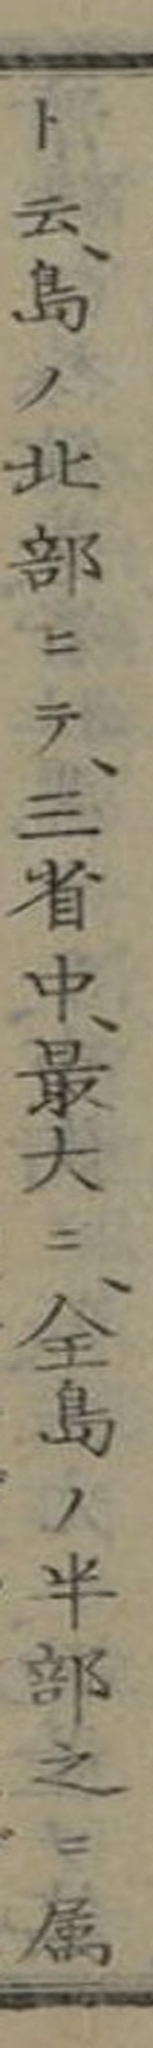ト云、島ノ北部ニテ、三省中、最大ニ、全島ノ半部之ニ属
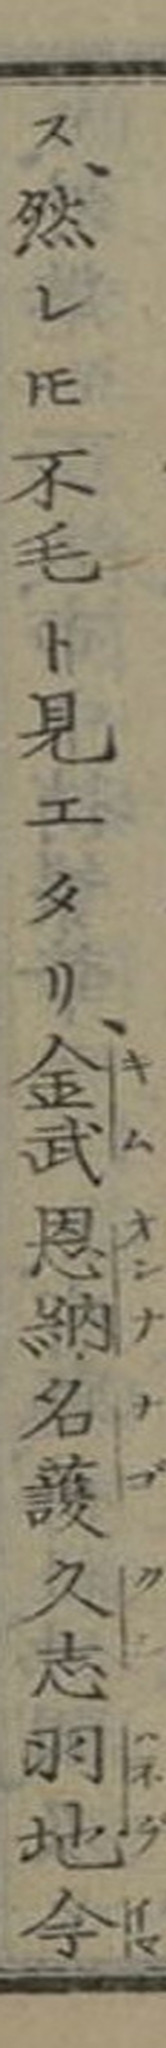ス、然レトモ不毛ト見エタリ、金武恩納名護久志羽地今
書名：琉球新誌 図附 上
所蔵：University of the Ryukyus Library
